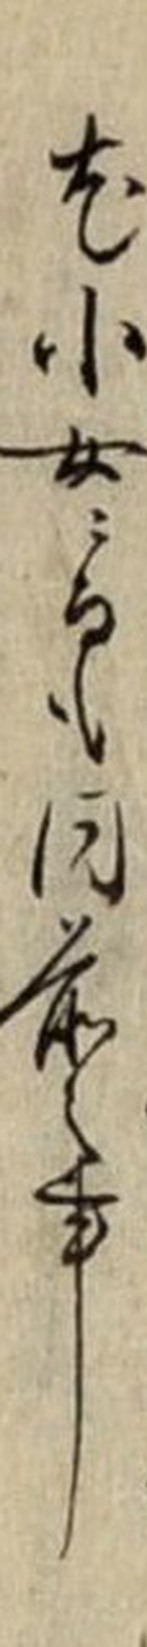尤小女にても同前之事
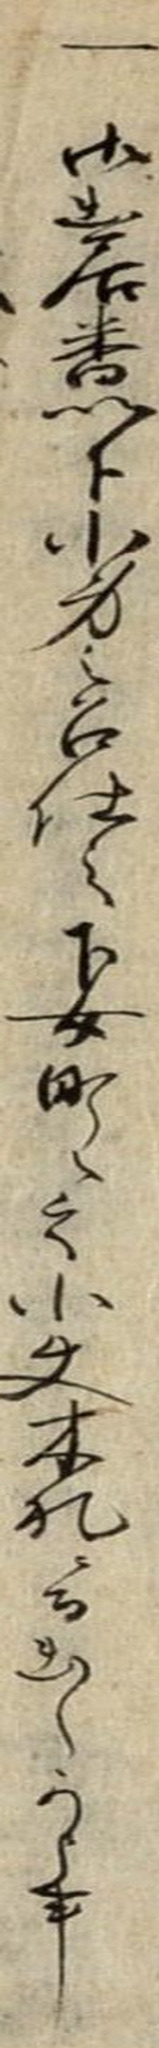一御出居番以下小身之召仕之下女町へ之小使木札にて出し可申事
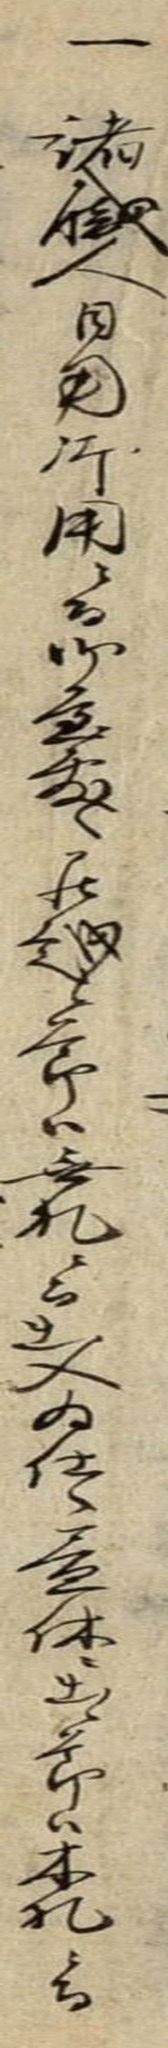一諸職人日用御用にて御屋敷へ罷越候節は無札にて出入為仕候昼休に出候節は木札にて
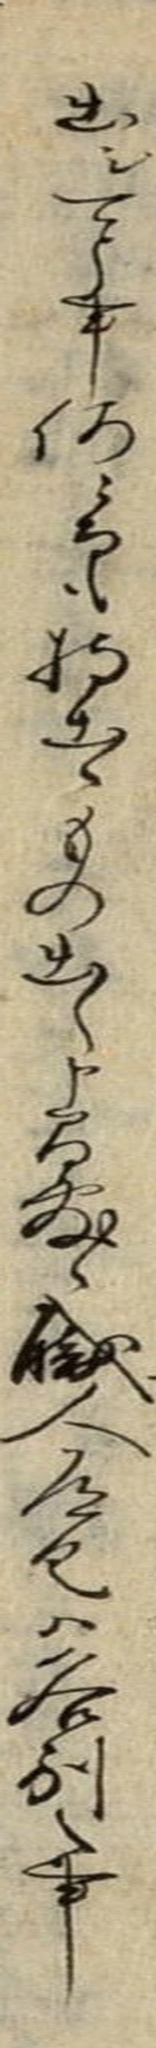出し可申事何にても持出候もの出し申間敷候職人道具は各別之事
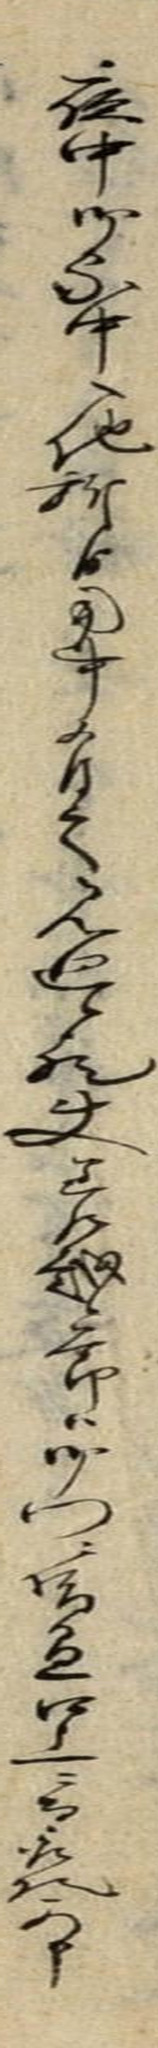一夜中御家中へ他所ゟ用事有之見廻候歟使差越候節は御門に指置口上にて取次可申
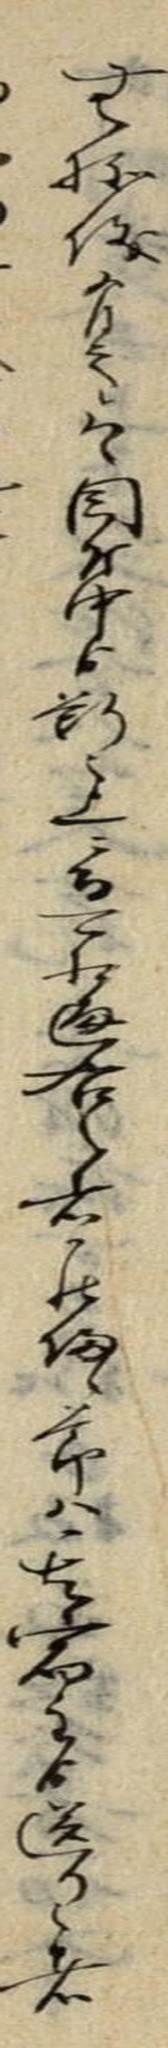無據儀有之候はゝ目付中ゟ断之上にて可相通右之者罷帰候節は其宿主ゟ送り之者
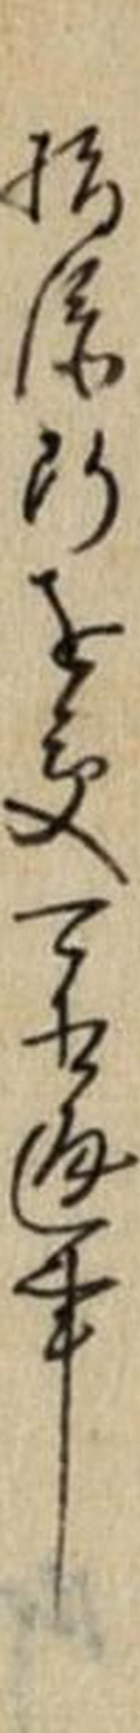指添断を受可相通事
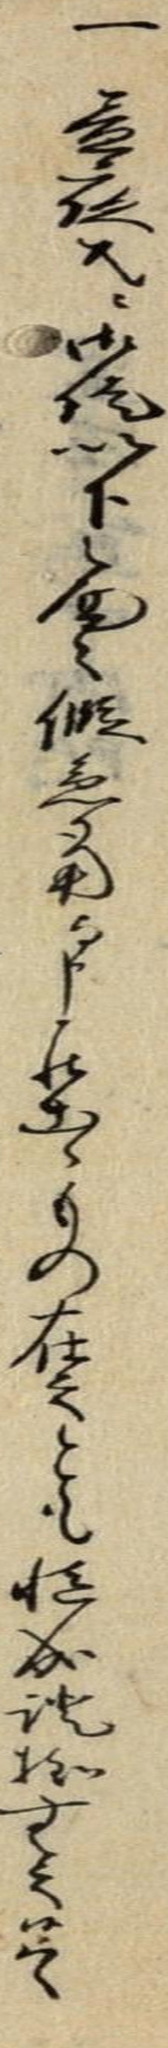一昼夜共に御徒以下之面々假急御用と申罷出候もの在之とも慥成証拠無之候はゝ
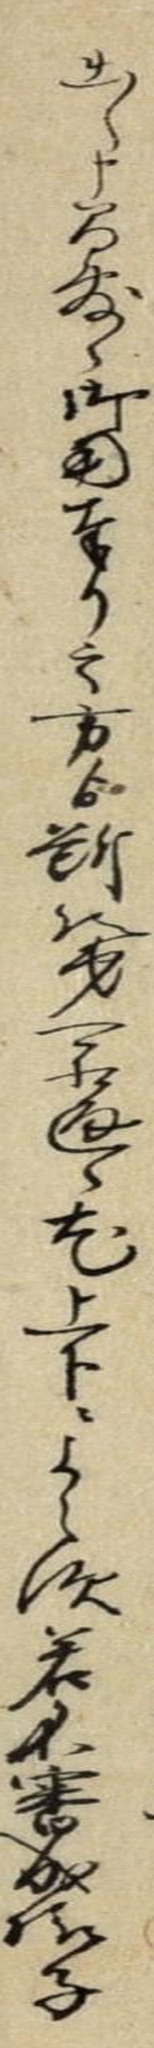出し申間敷候御用奉り之方ゟ断次第可相通候尤上下によらす若不審成様子
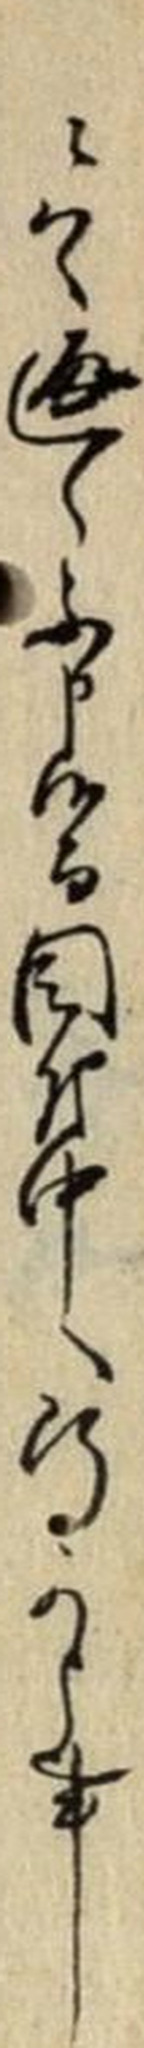候はゝ通し不申候て目付中へ断可申事
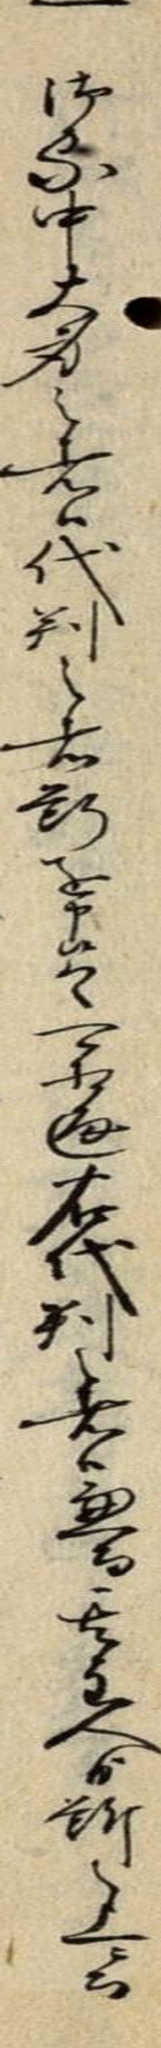一御家中大身之者は代判之者断を申候はゝ可相通右代判之者は兼て其主人より断之上にて
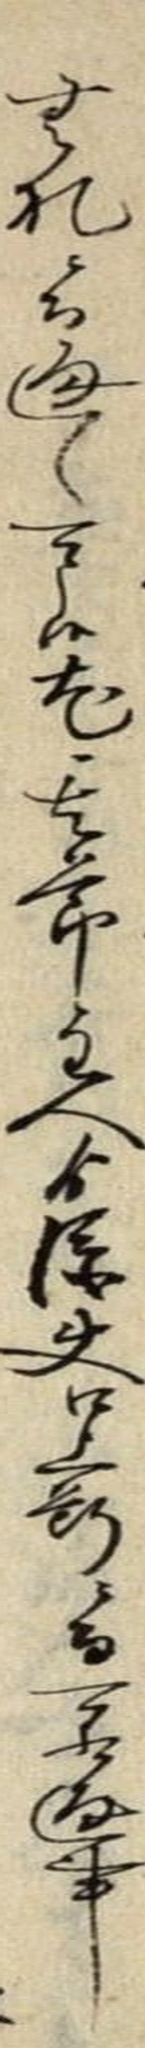無札にて通し可申候尤其節主人ゟ添使口上断にて可相通事
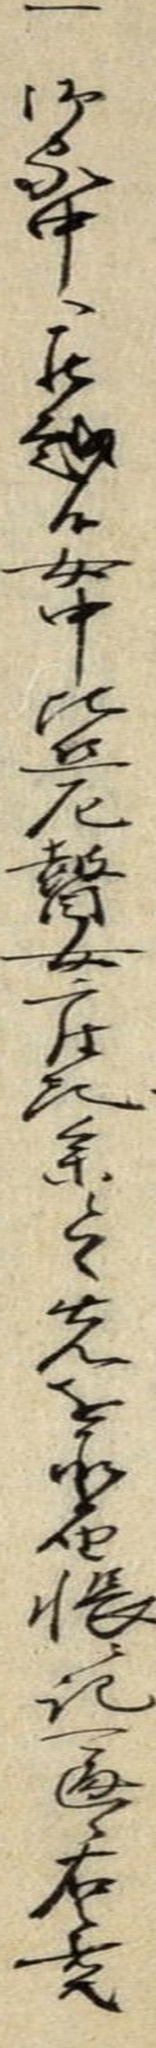一御家中へ罷越候女中比丘尼瞽女座頭参候はゝ先を承届帳に記可通候右之者共
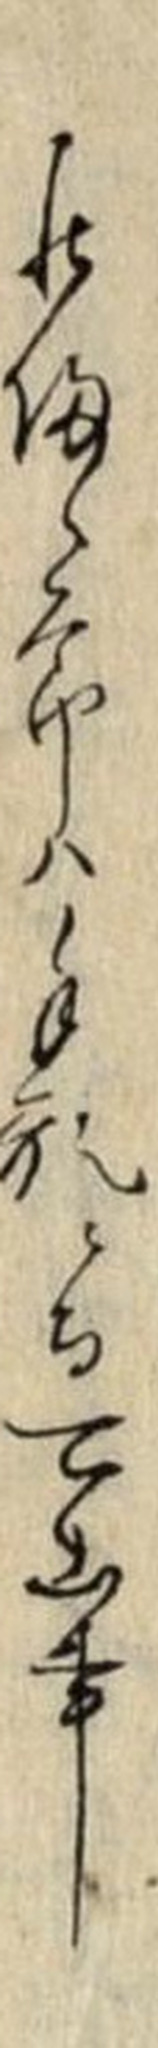罷帰候其節は手形にて可出事
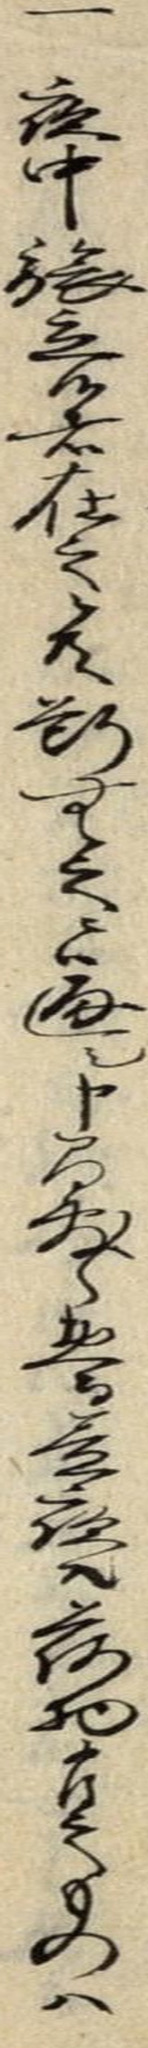一夜中旅立候者在之候共断無之には通し申間敷候惣て昼夜共荷物有之ものは
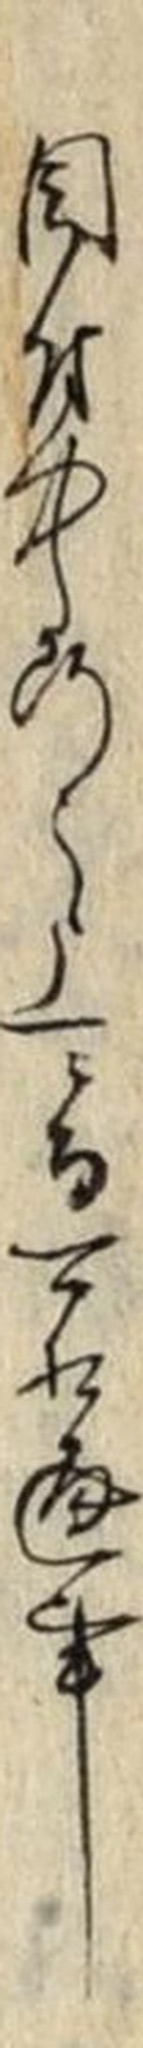目付中断之上にて可相通事
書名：三都并道中之部
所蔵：福井県文書館 Fukui Prefectural Archives
